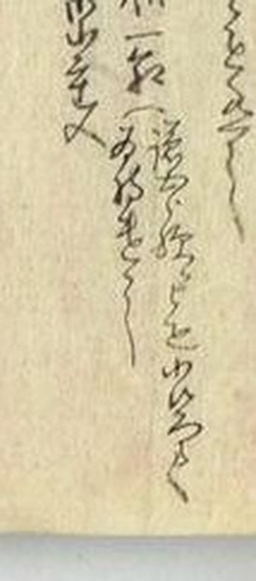為持遣之
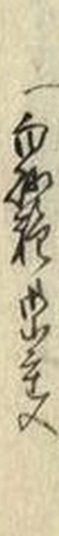白砂糖御小重入

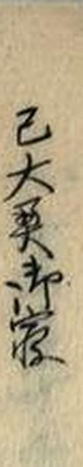己大奥御寝
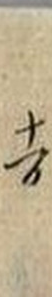十四日
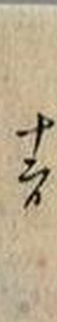十四日
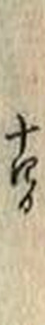十四日
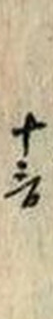十四日
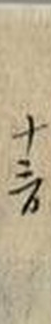十四日
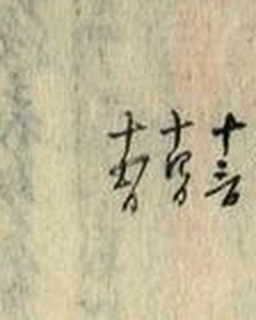十五日
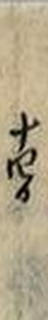十四日
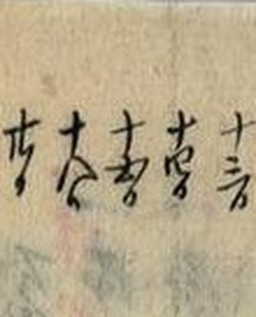十五日
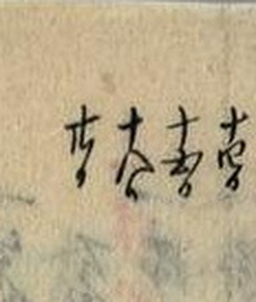十四日
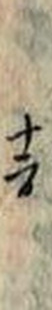十四日
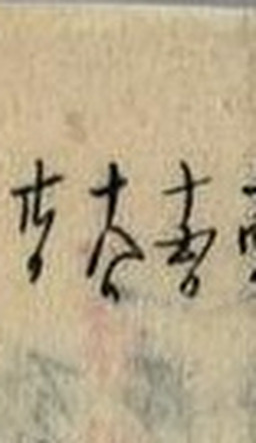廿一日
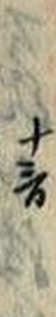十四日
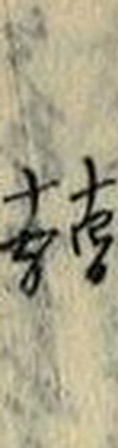十四日
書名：少傅日録抄（斉承付側向頭取日記、在国）
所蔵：福井県文書館 Fukui Prefectural Archives
